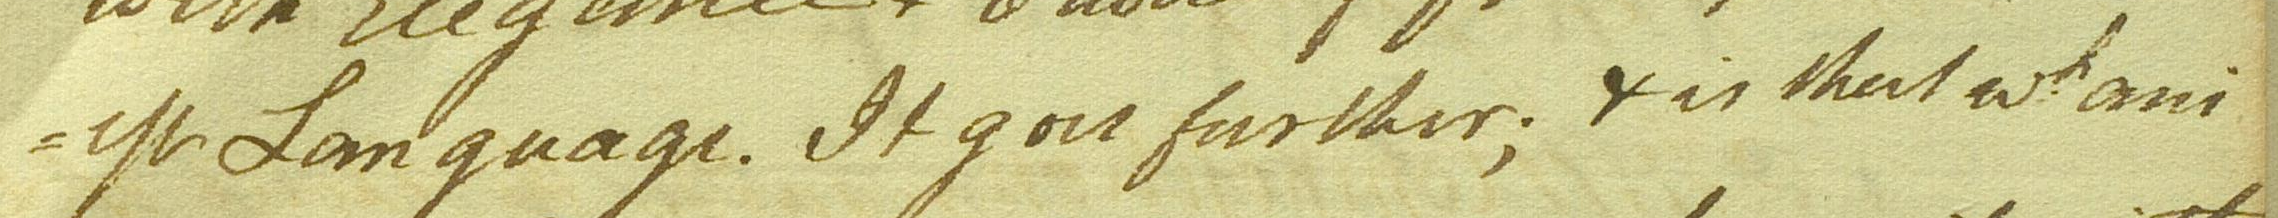-est Language. It goes further; & is that w^h ani
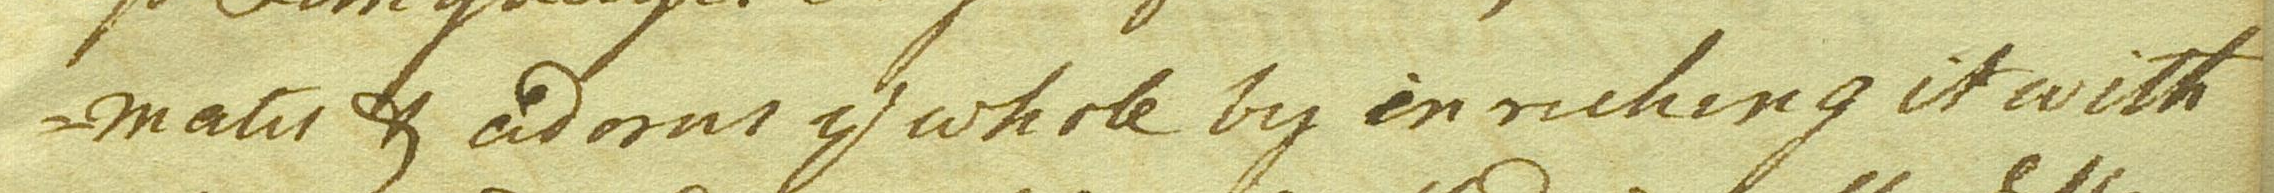-mates & adorns y^e whole by enriching it with
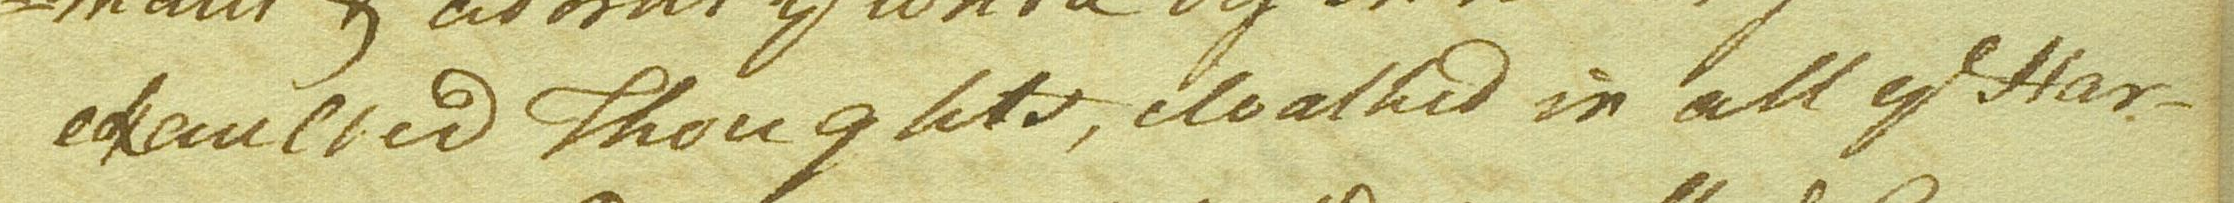educated Thoughts, cloathed in all y^e Har-
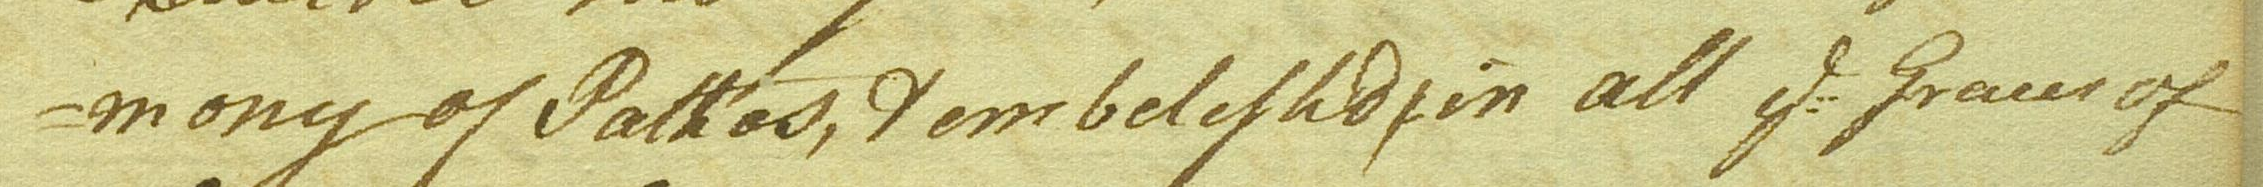-mony of Pathos, & embelesh'd, in all y^e Graces of
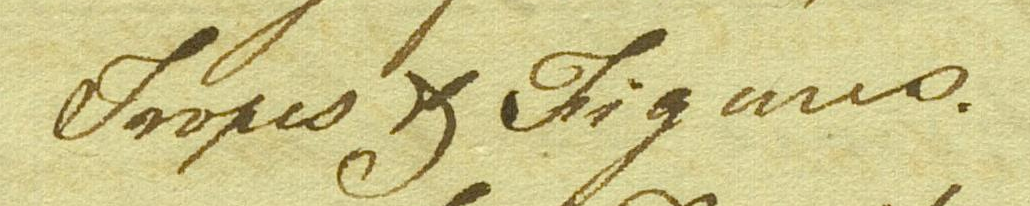Tropes & Figures.
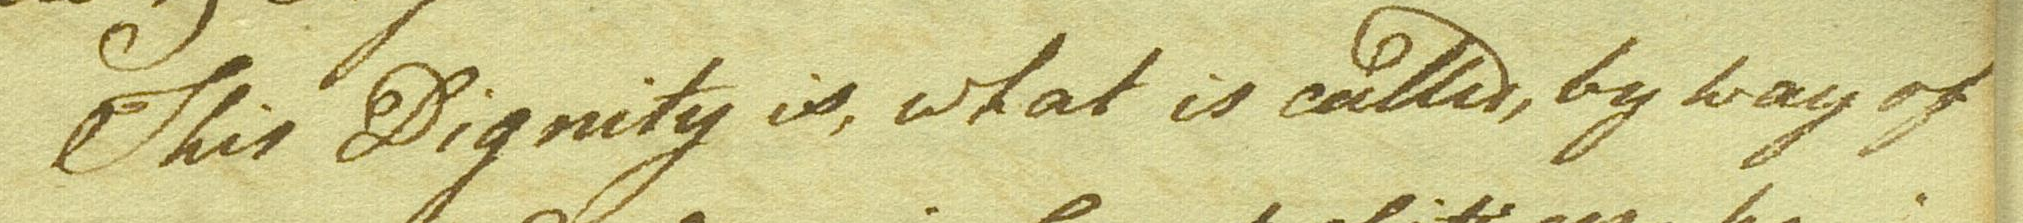This Dignity is, what is called, by way of
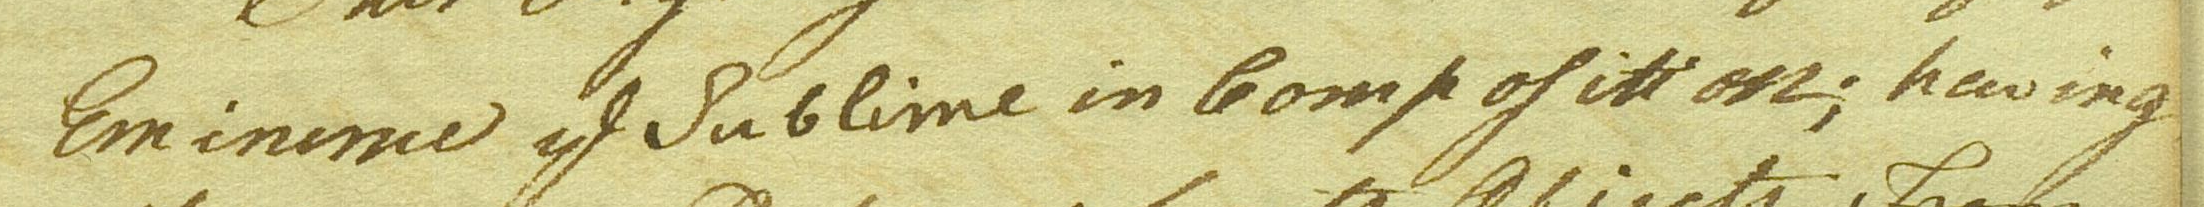Eminence y^e Sublime in Composition; hewing
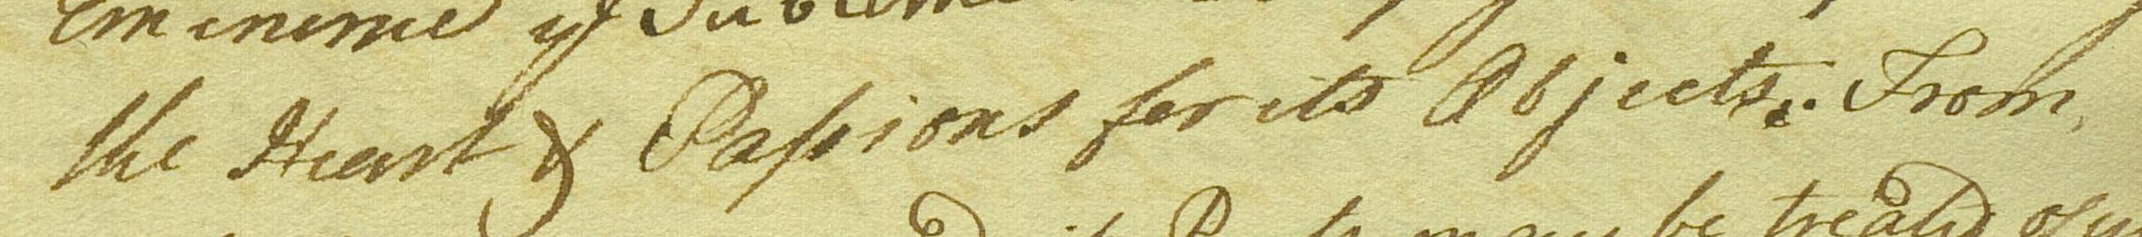the Heart & Passions for its Objects. From,
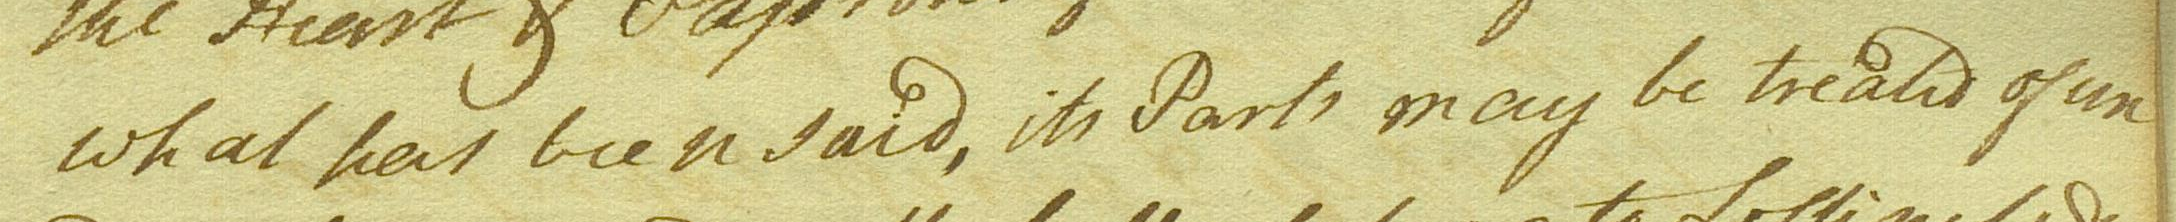what has been said, its Parts may be treated often
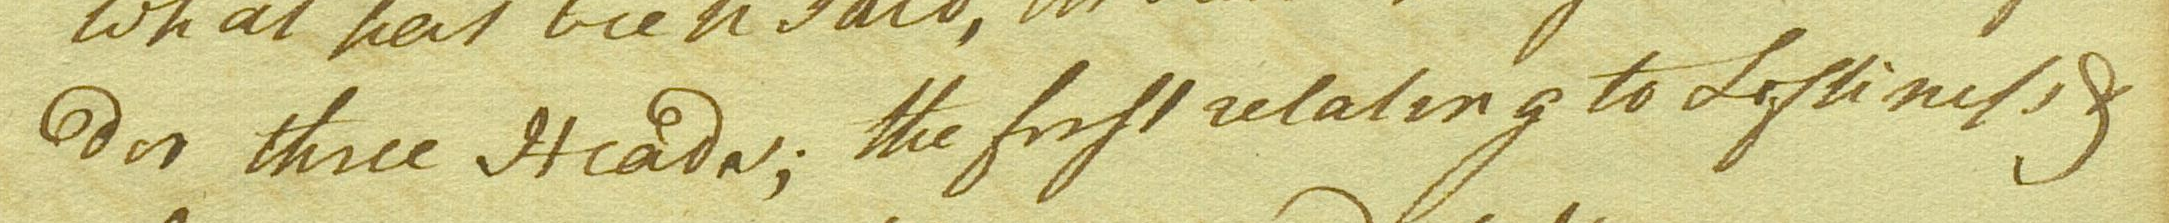der three Heads; the first relating to Loftiness &
